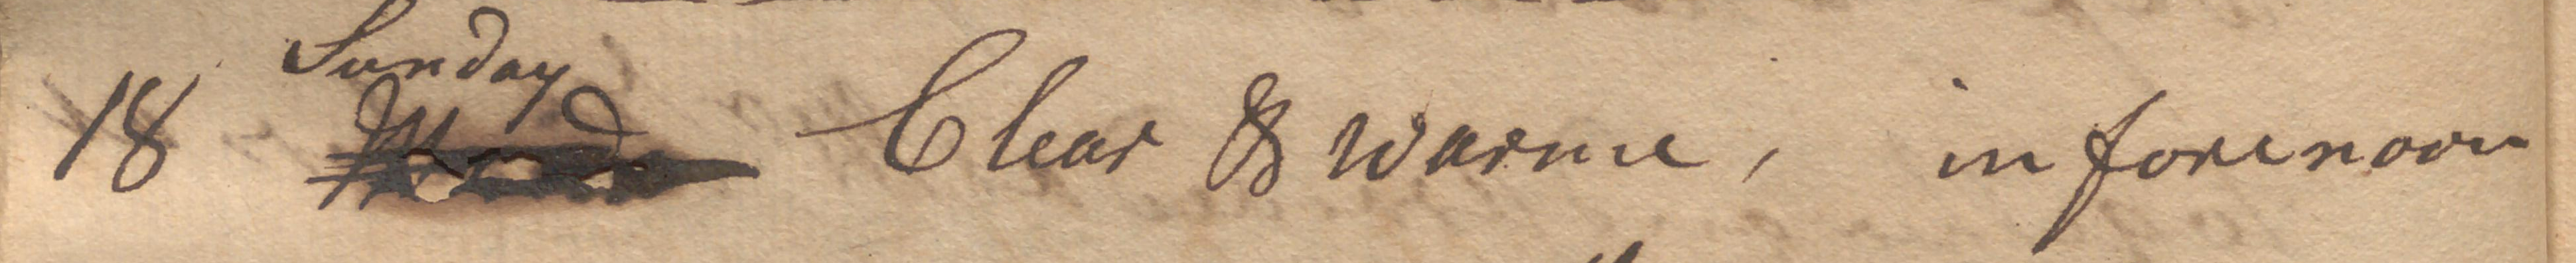18 [______] Clear & Warme, in forenoon
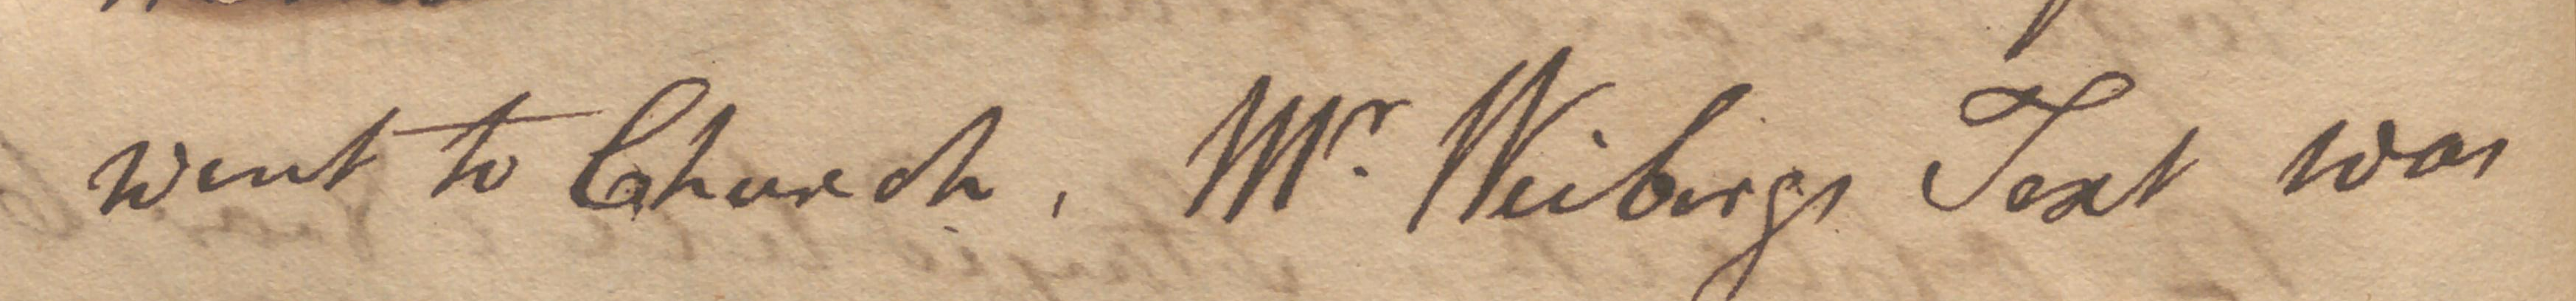went to Church. M^r. Weibergs Text was
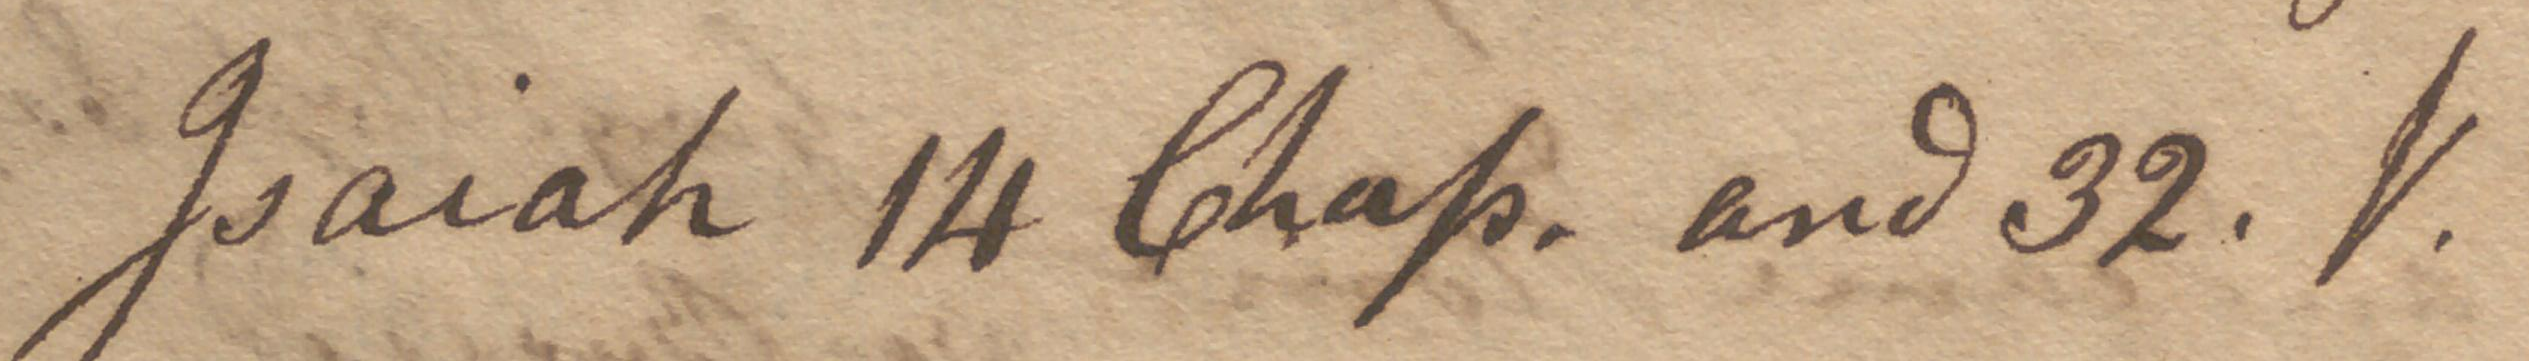Isaiah 14 Chap- and 32. V.
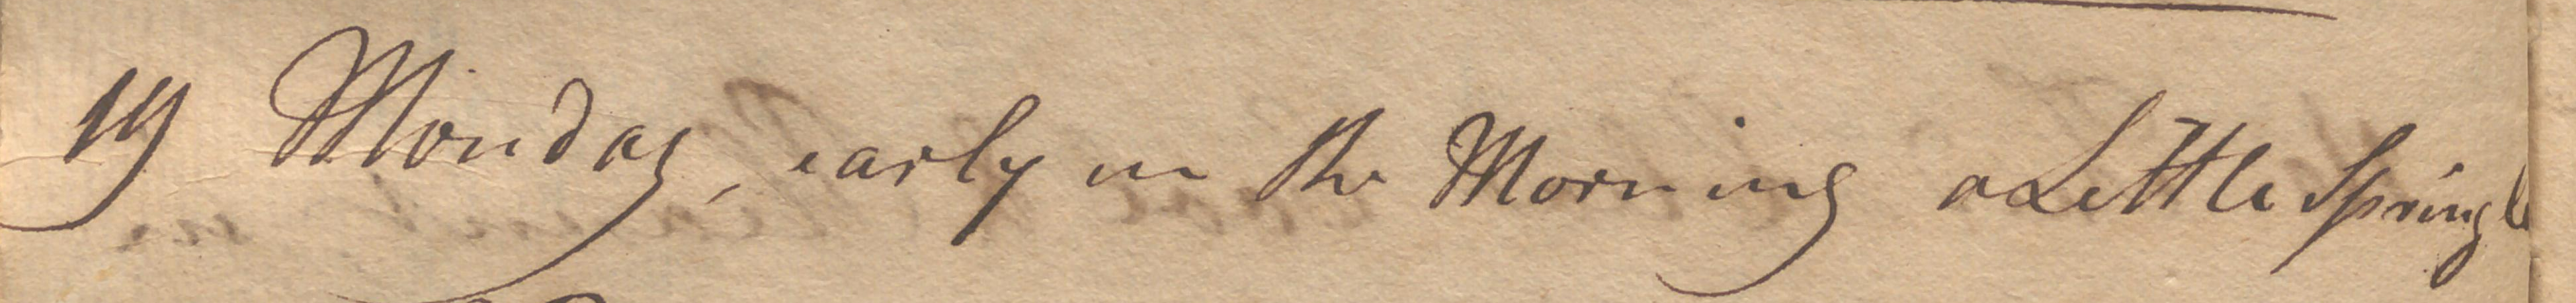19 Monday early in the Morning a Little spring
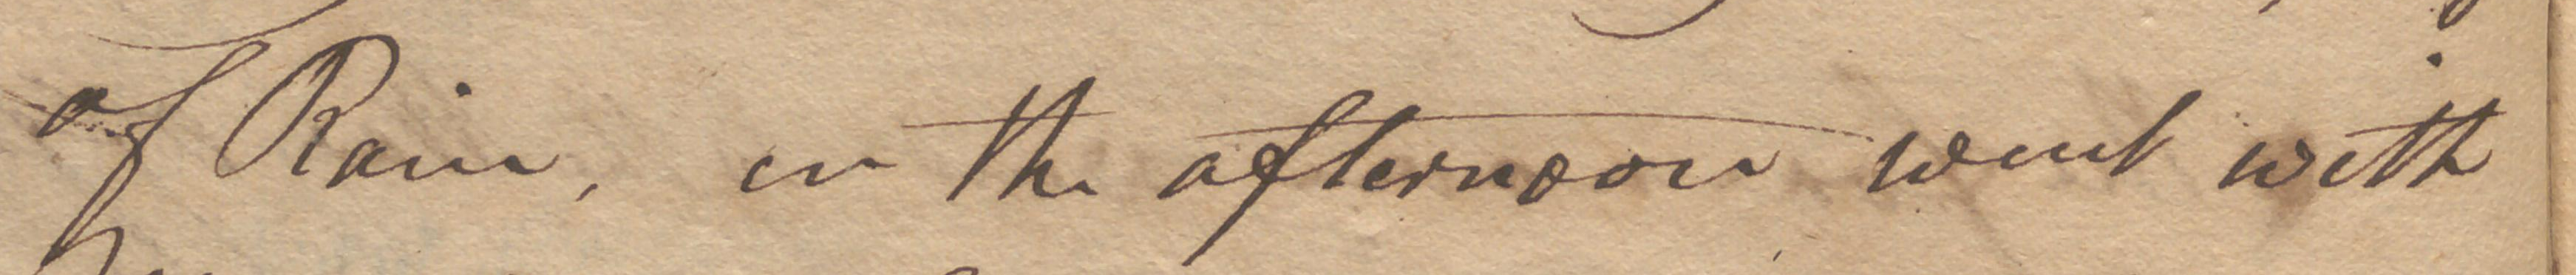of Rain, in the afternoon went with
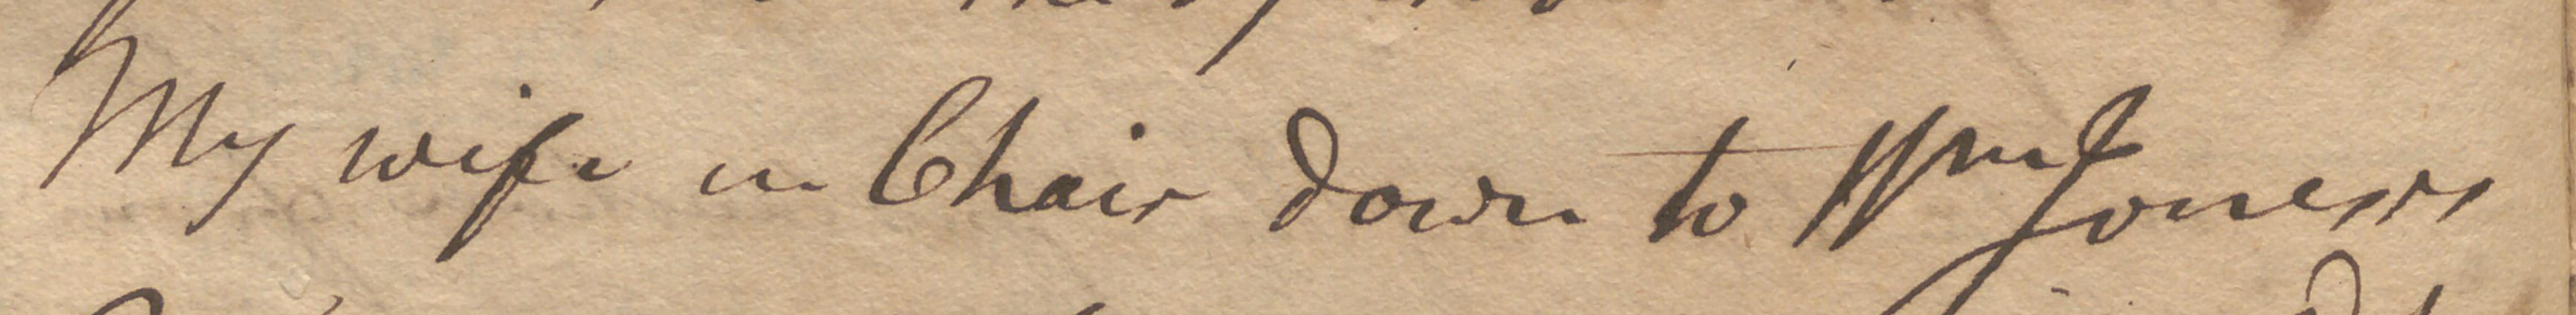My wife in Chair down to W^m Joneses
